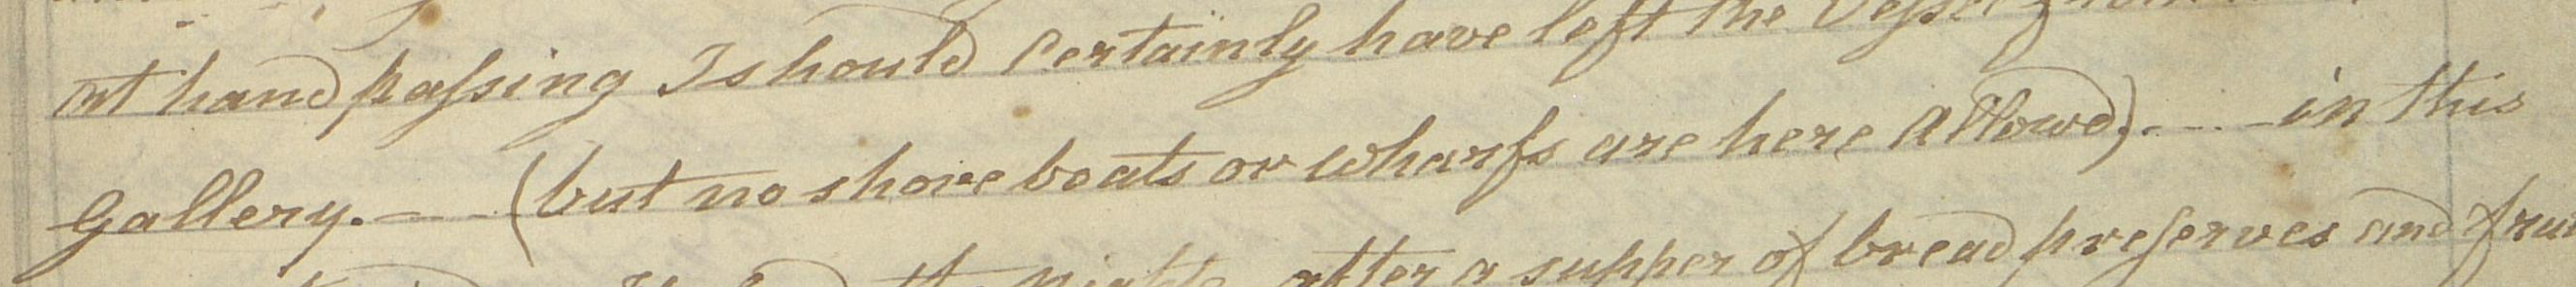Gallery. (but no shore boats or wharfs are here allowed) in this
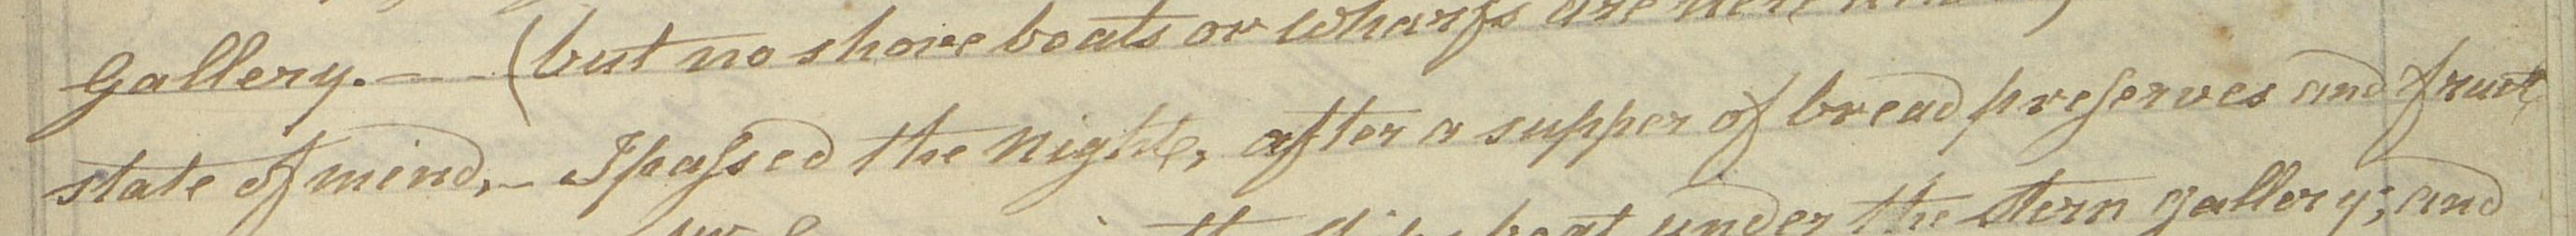state of mind, I passed the Night, after a supper of bread preserves and fruit
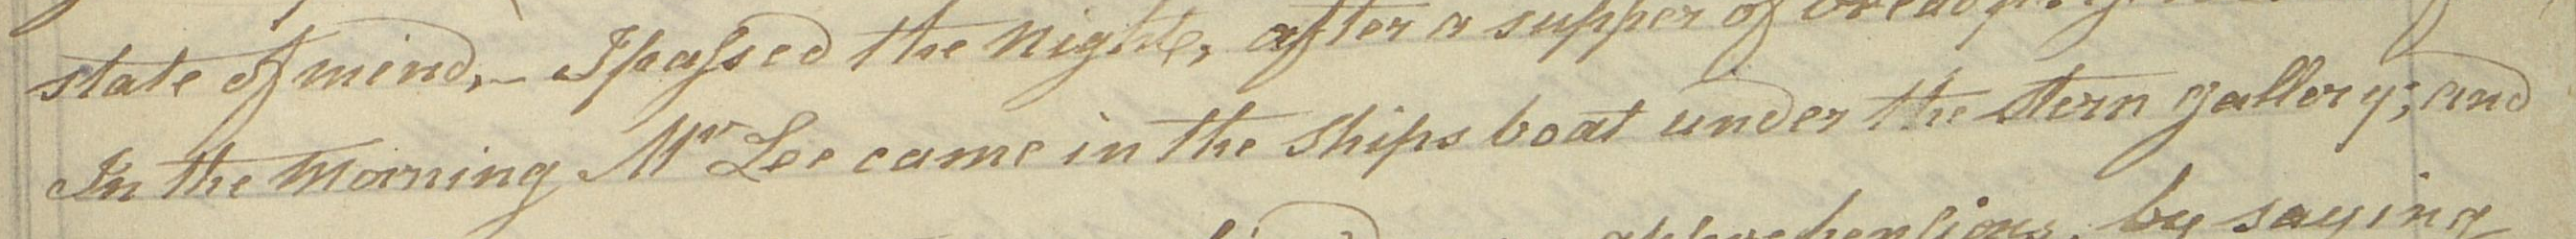In the Morning M^r. Lee came in the ships boat under the stern gallery; and
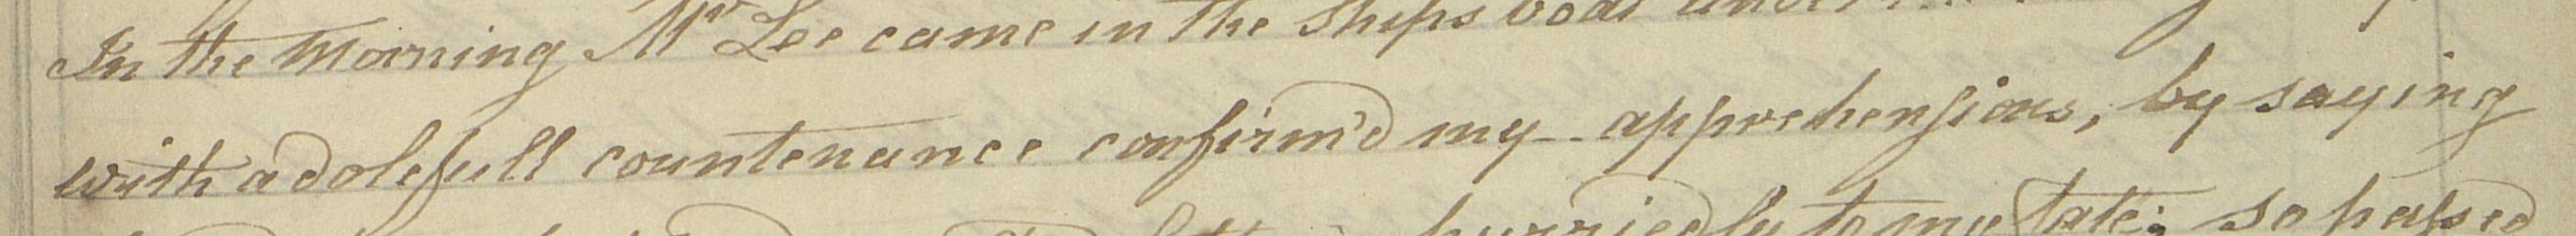with a dolefull countenance confirm'd my apprehensions, by saying
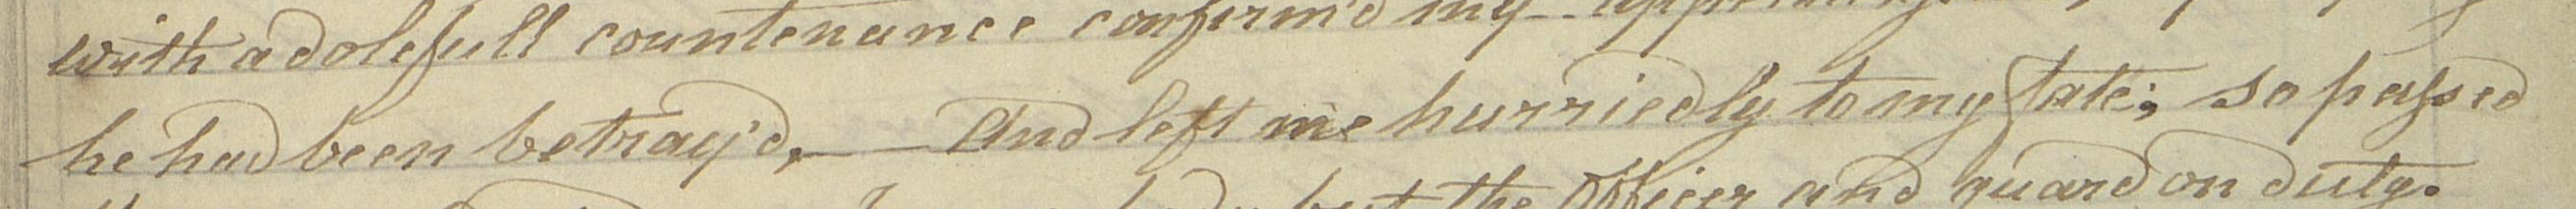he had been betray'd, And left me hurriedly to my fate; so passed
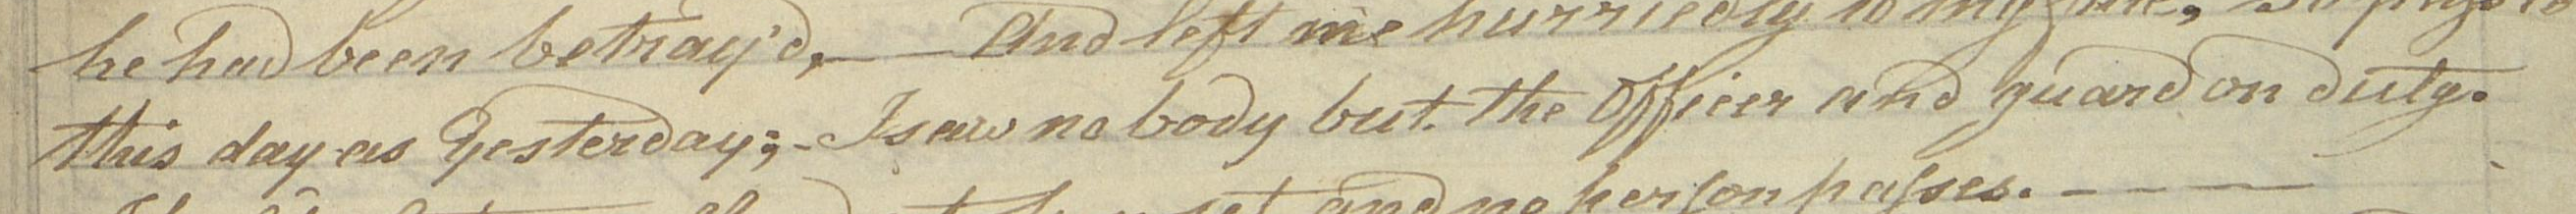this day as Yesterday; I saw no body but the Officer and Guard on duty.
